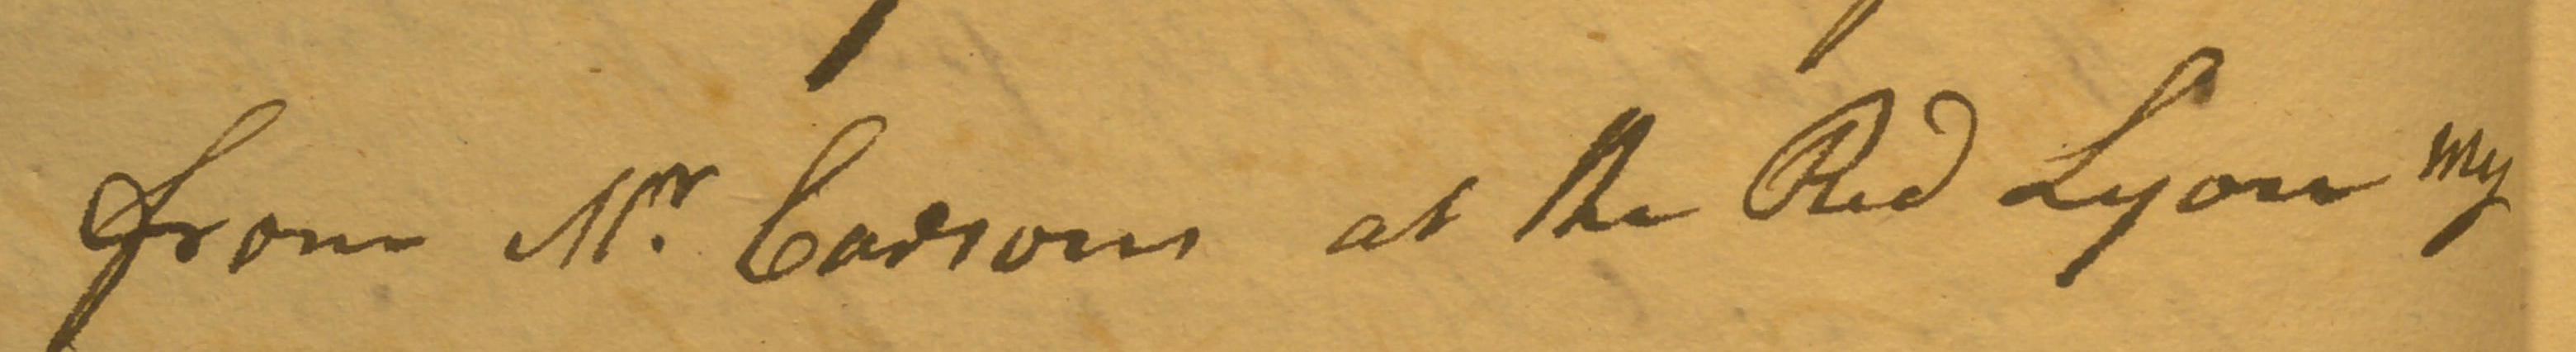from M^r. Carsons at the Red Lyon My
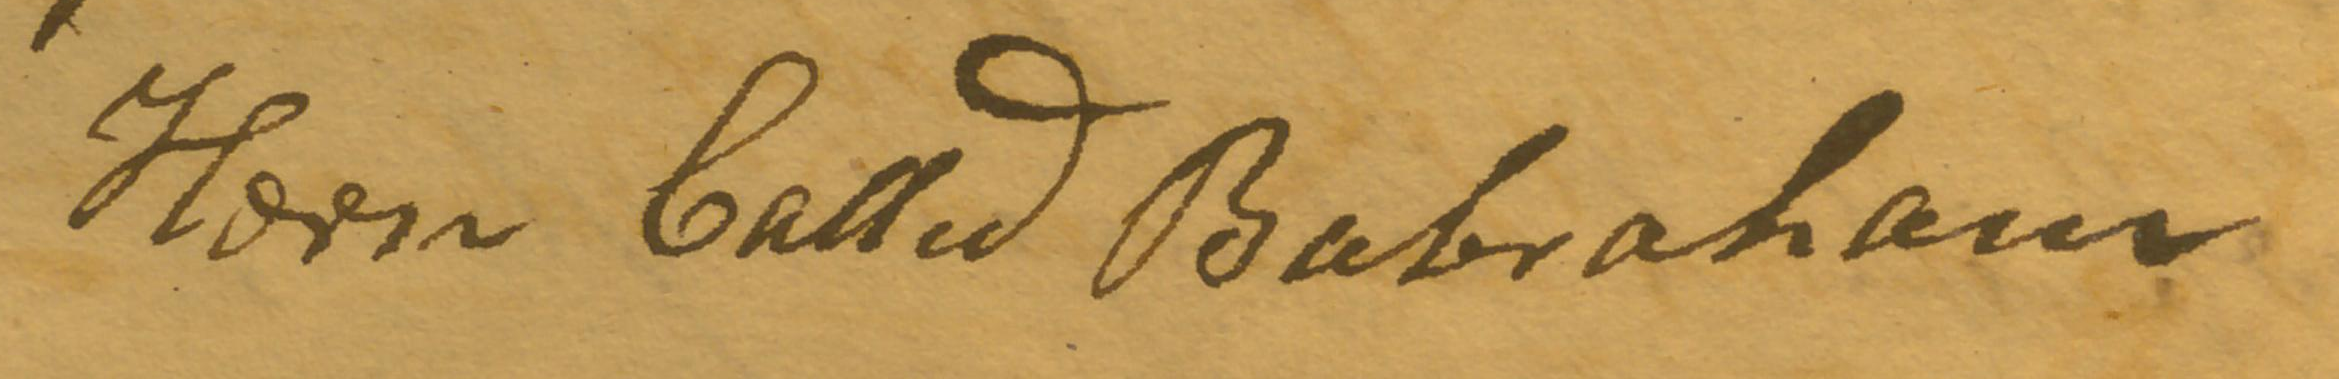Horm Called Babraham
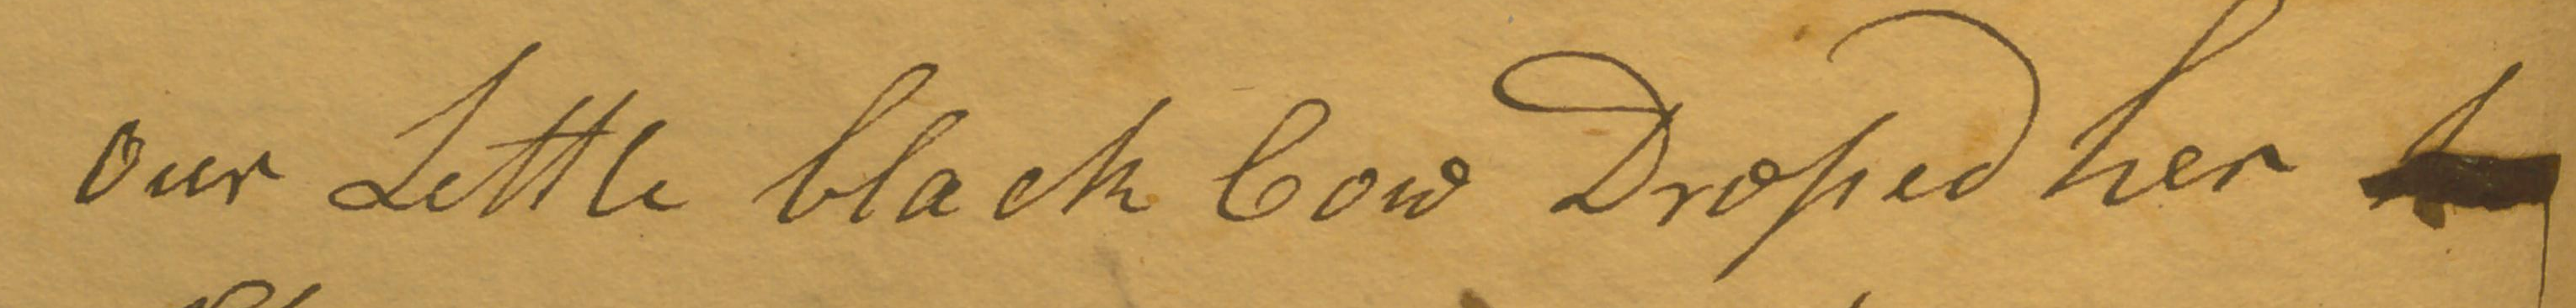our Little black Cow Droped her
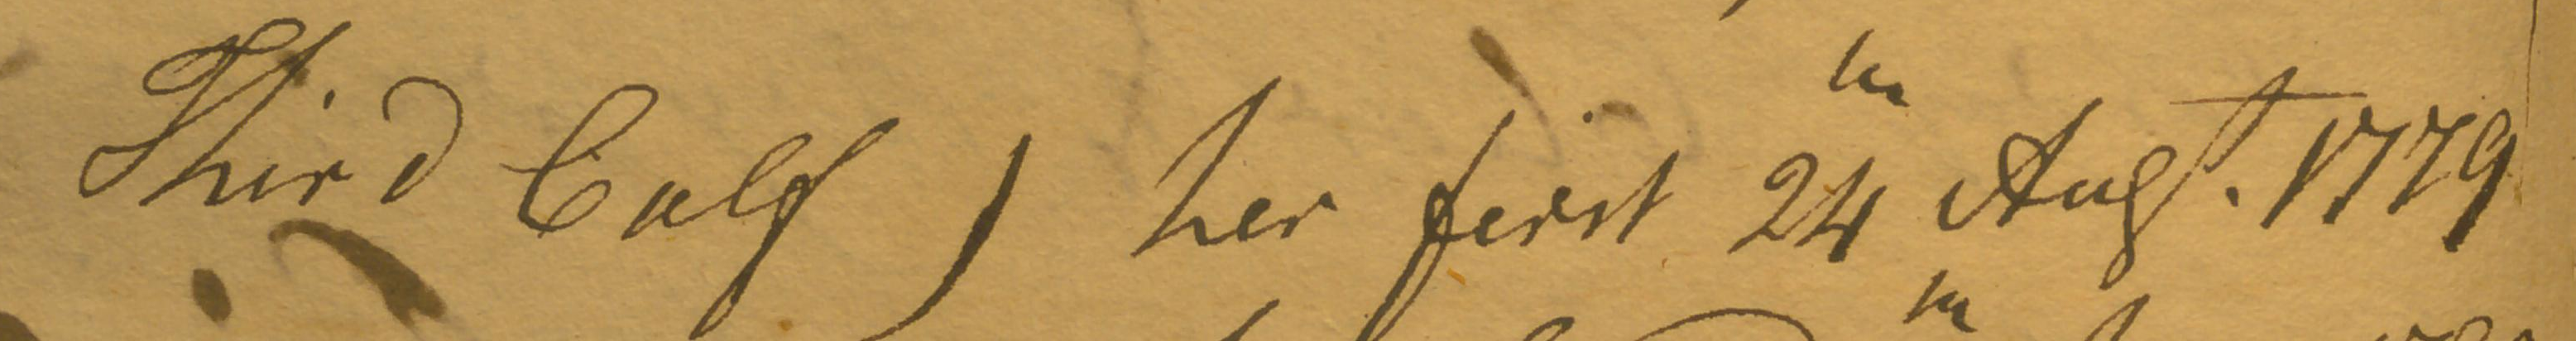Third Calf) her first 24^th Aug^t. 1779
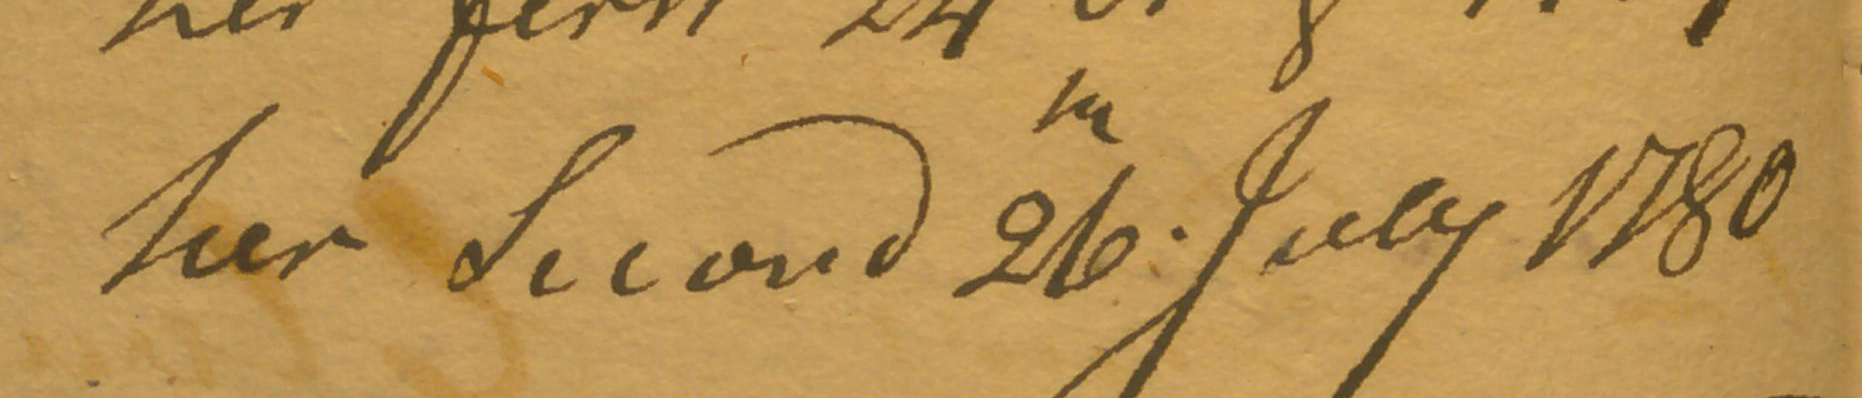her second 26th. July 1780
